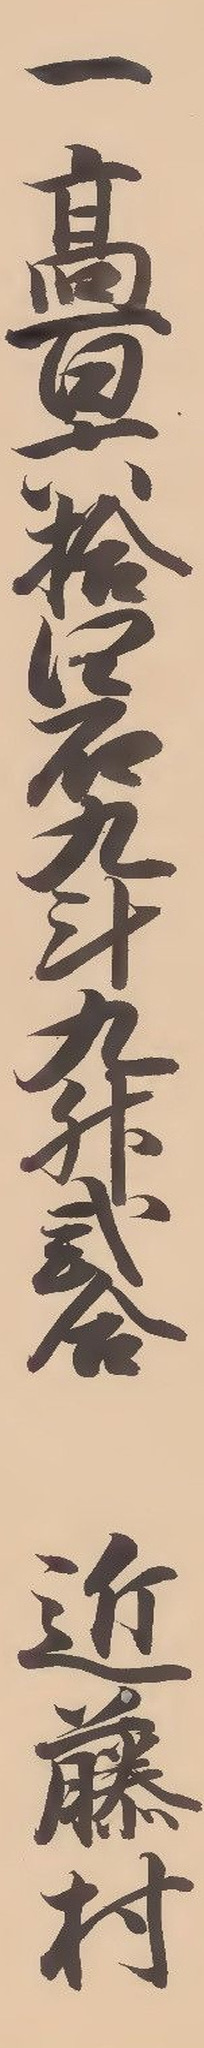一高百六拾四石九斗九升弐合近藤村
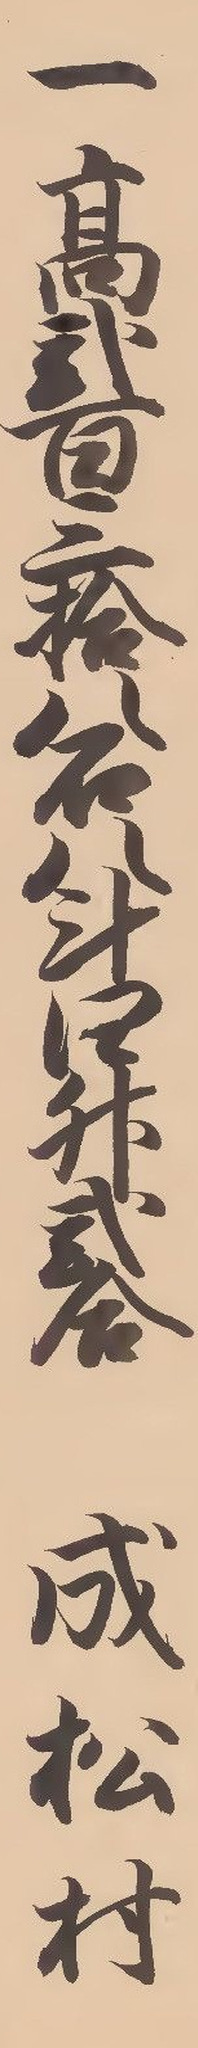一高弐百三拾八石八斗四升弐合成松村
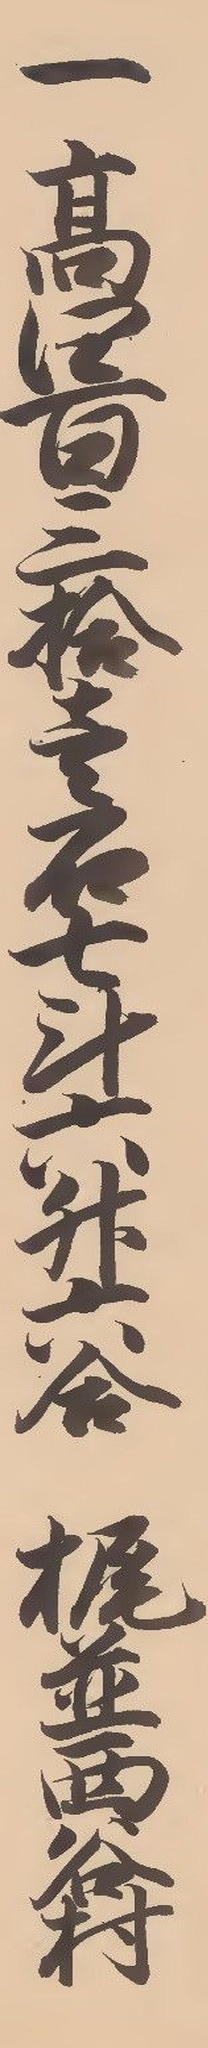一高四百三拾壱石七斗六升六合梶並西谷村
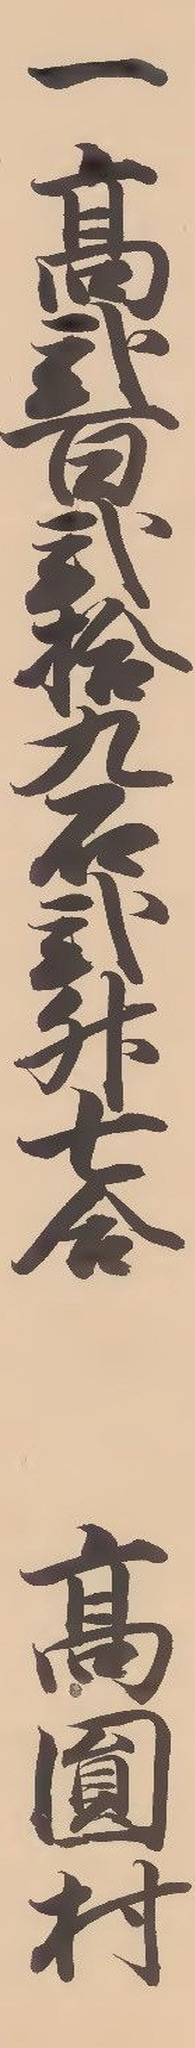一高弐百弐拾九石弐升七合高円村
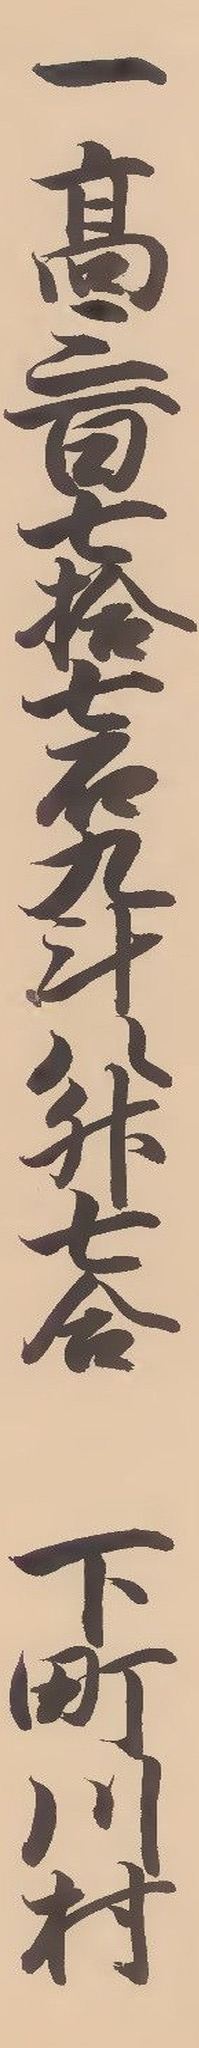一高三百七拾七石九斗八升七合下町川村

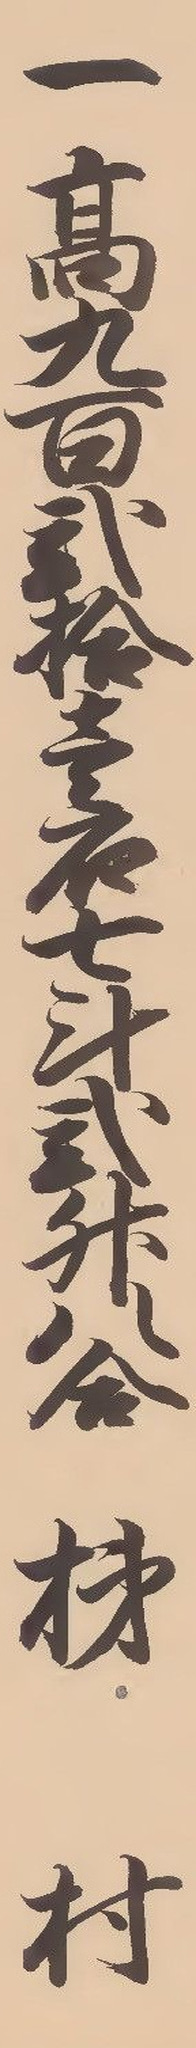一高九百弐拾壱石七斗弐升八合柿村
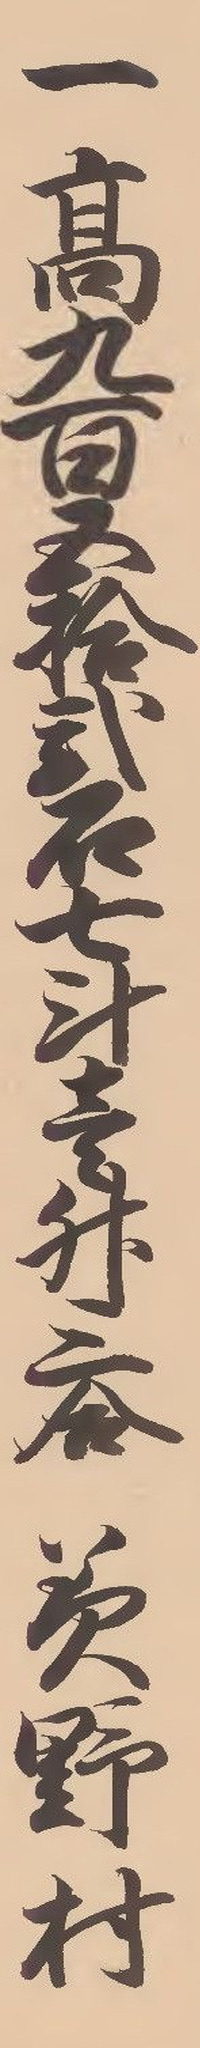一高九百五拾弐石七斗壱升三合美野村
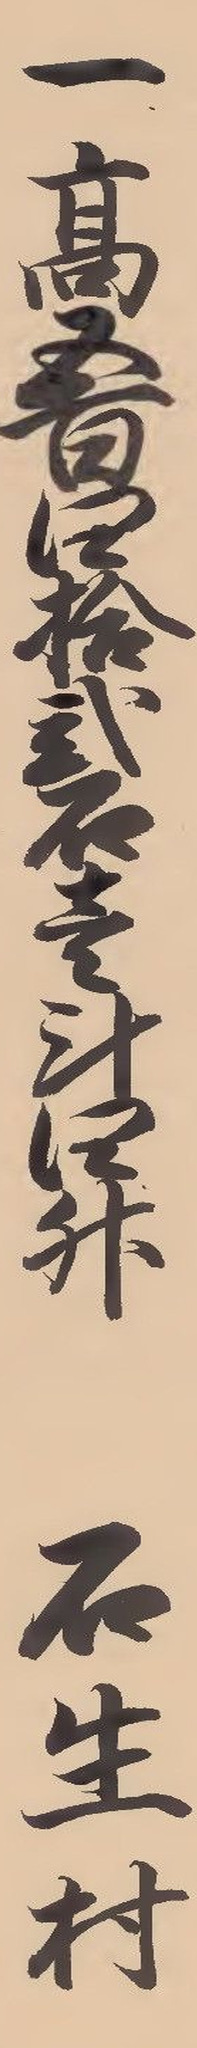一高五百四拾弐石壱斗四升石生村
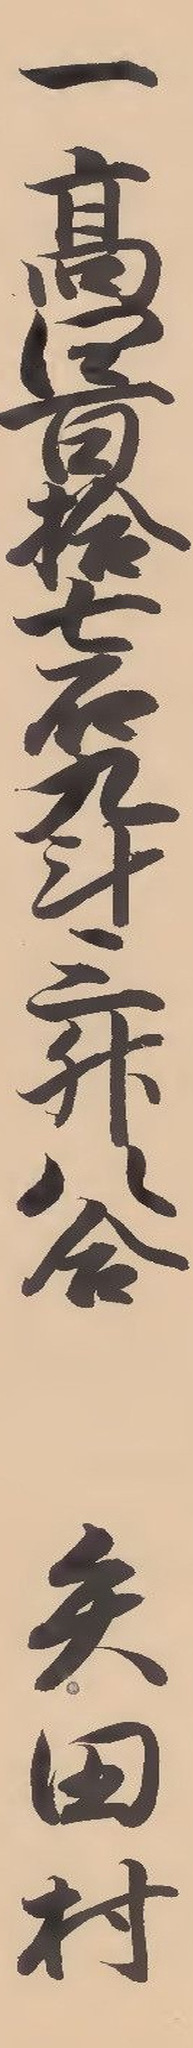一高四百拾七石九斗三升八合矢田村
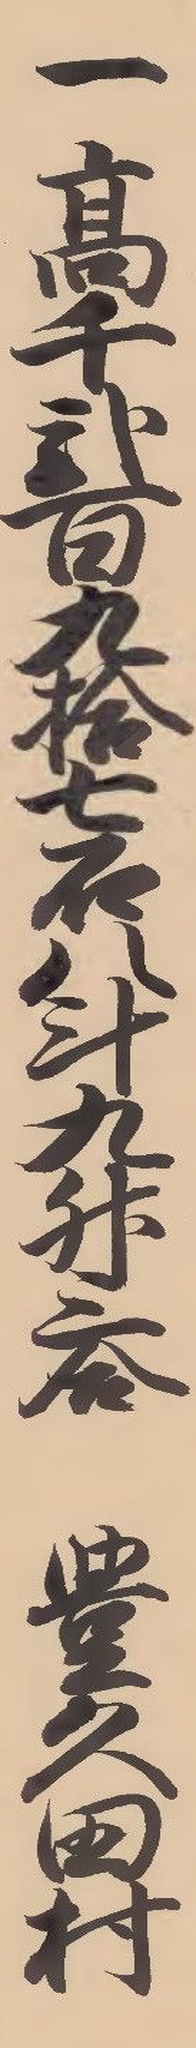一高千弐百九拾七石八斗九升三合豊久田村
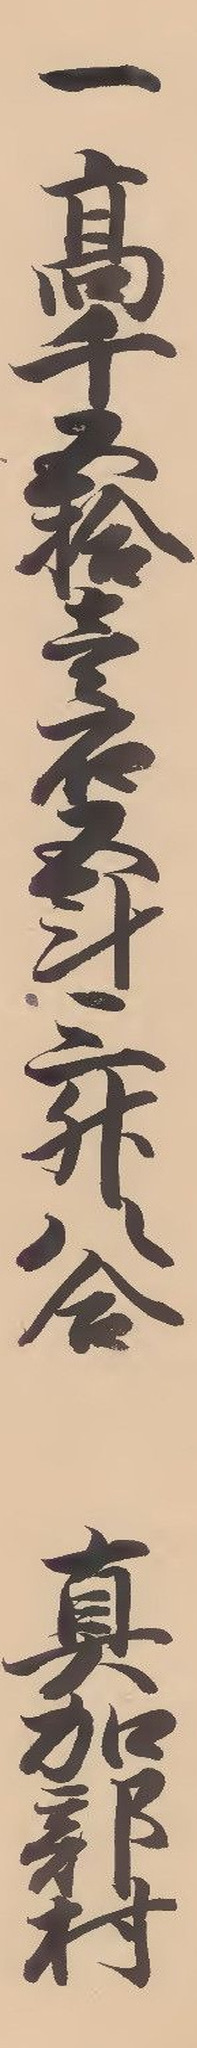一高千五拾壱石五斗三升八合真加部村

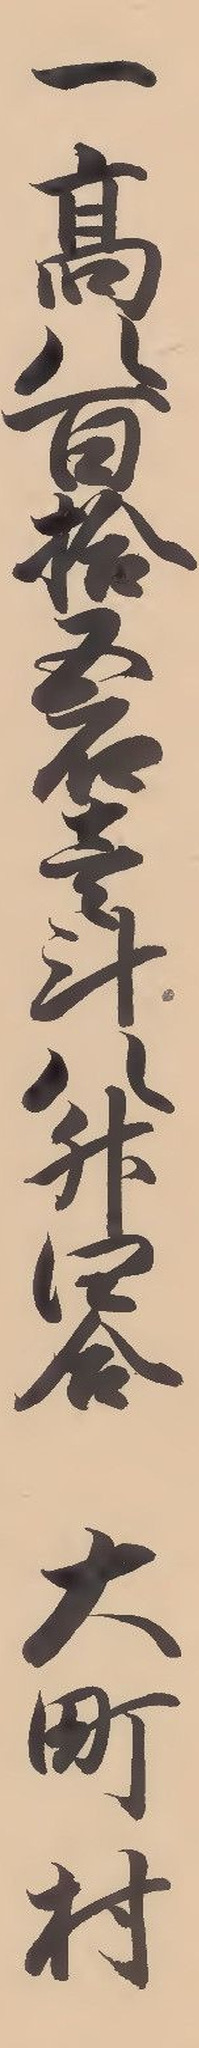一高八百拾五石壱斗八升四合大町村
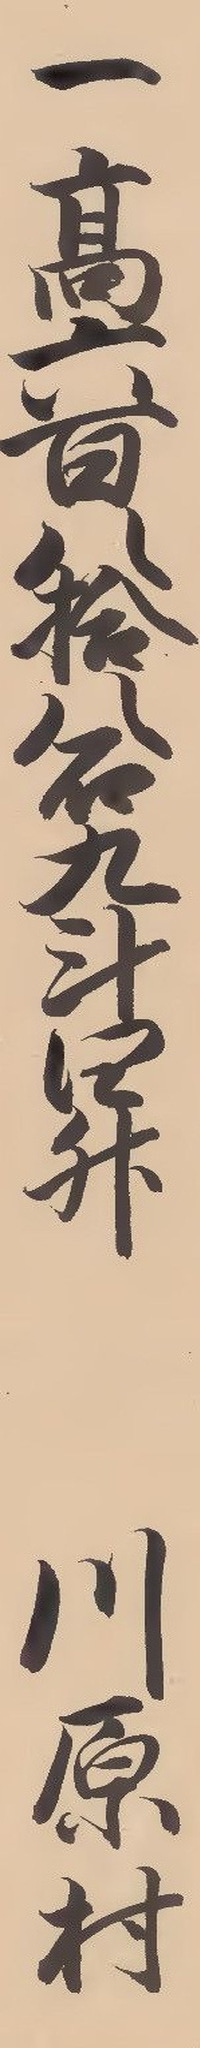一高六百八拾八石九斗四升川原村
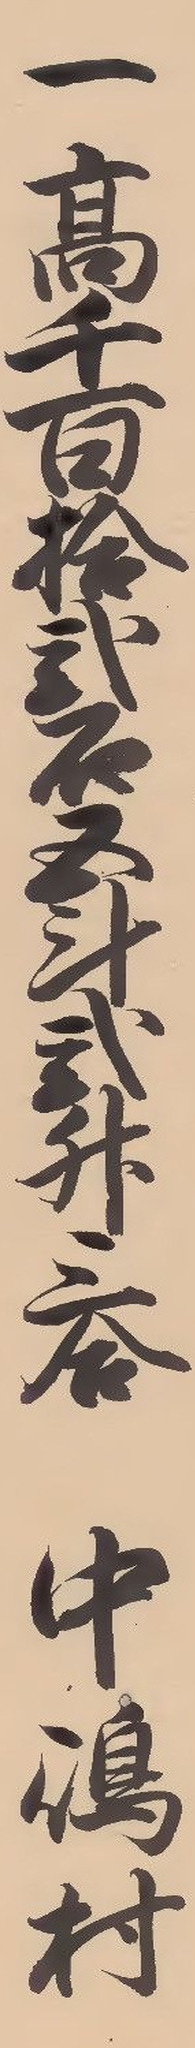一高千百拾弐石五斗弐升三合中島村
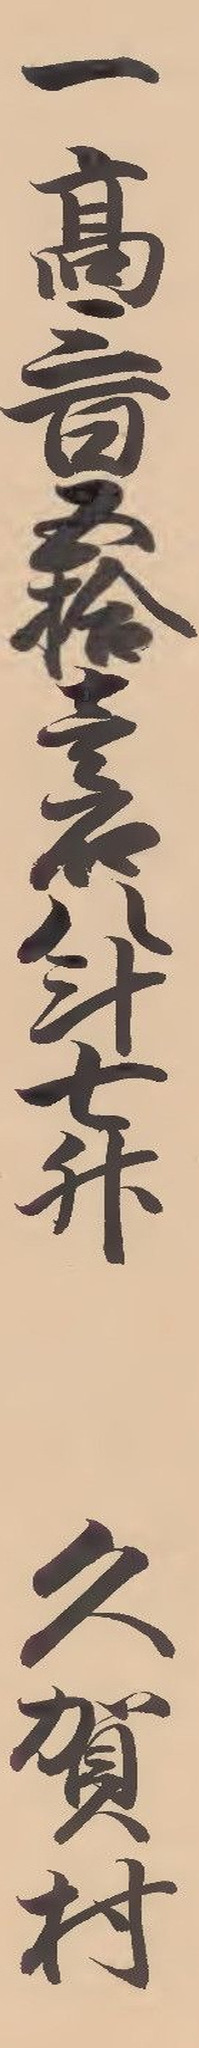一高三百五拾壱石八斗七升久賀村
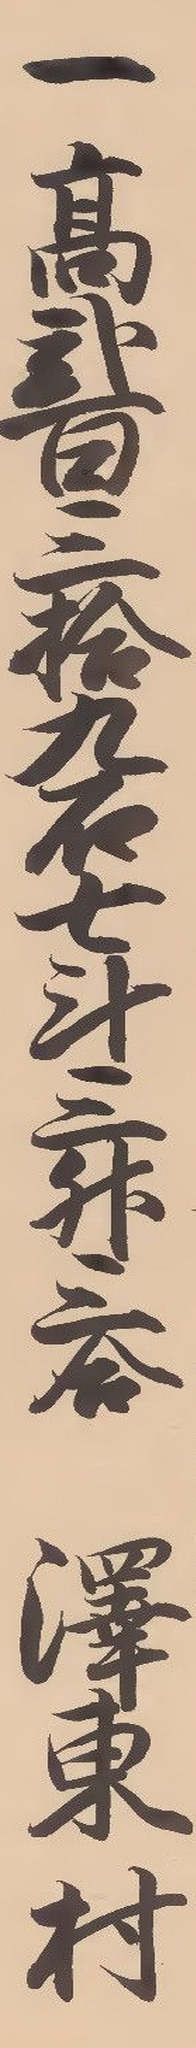一高八百三拾三石七斗三升九合北野村
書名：美作国郷帳
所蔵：国立公文書館 National Archives of Japan
